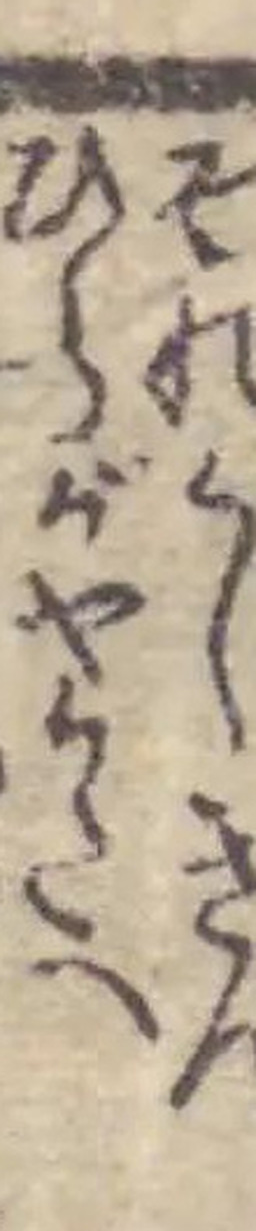ひらがやかたへ
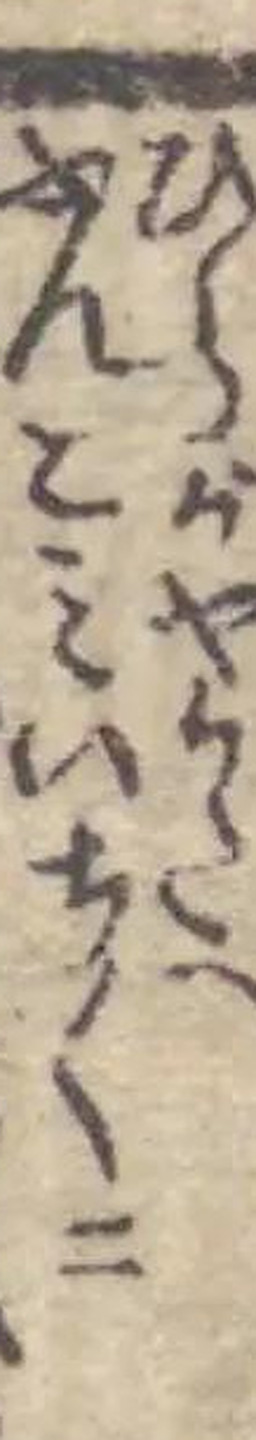ふんこみいち〳〵に
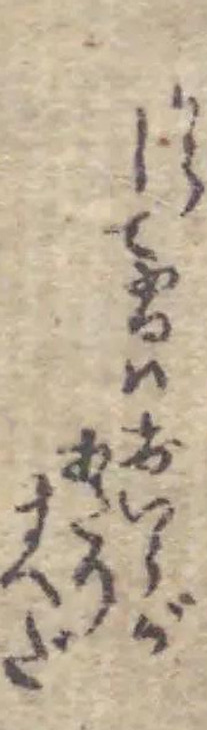してやるはおいらが
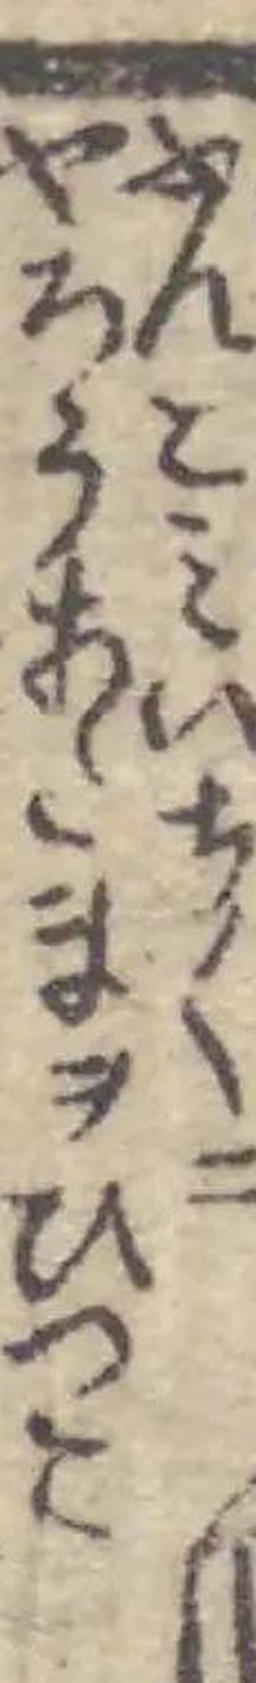やろうあたまをひつこ
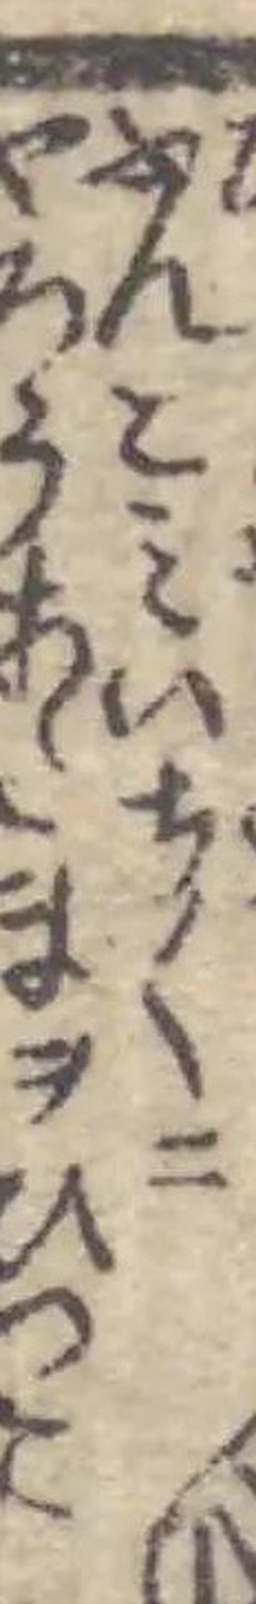やろうあたまをひつこ
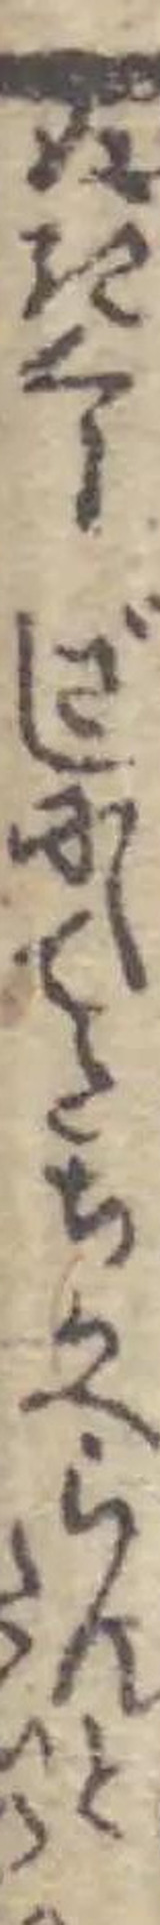ぬきくしざしにしてたちかへらんと
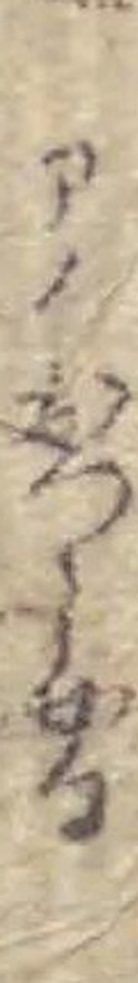あのおつしやる
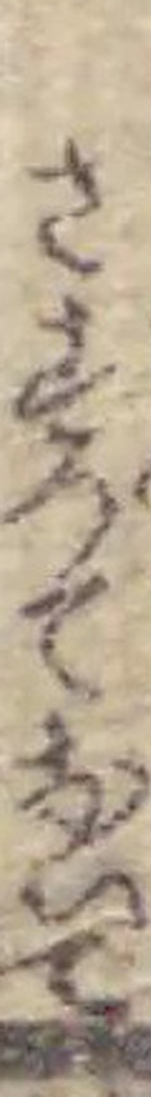さすつておいて
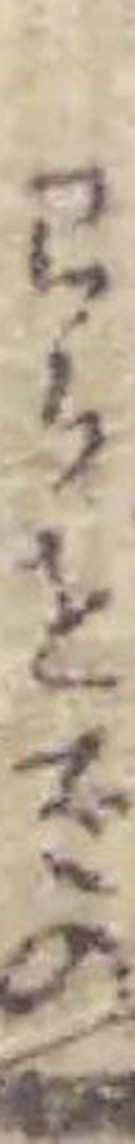わらをでの
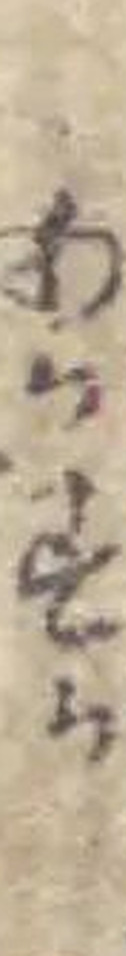あかすり
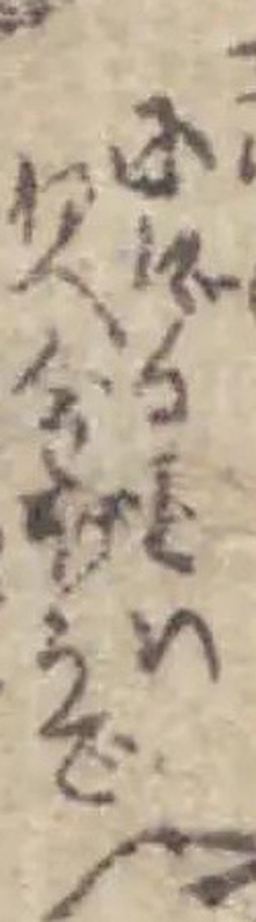ねへ金ぼうで
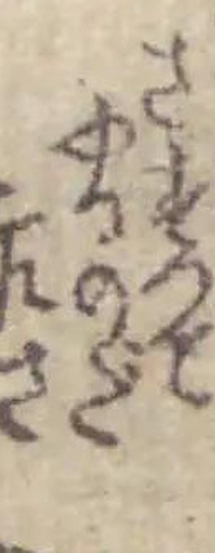やるのだ
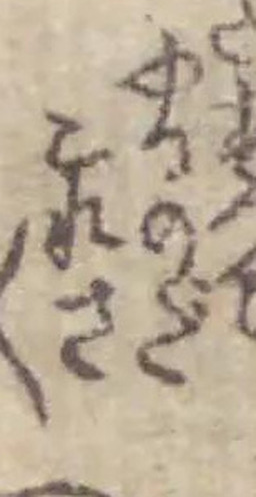これさ
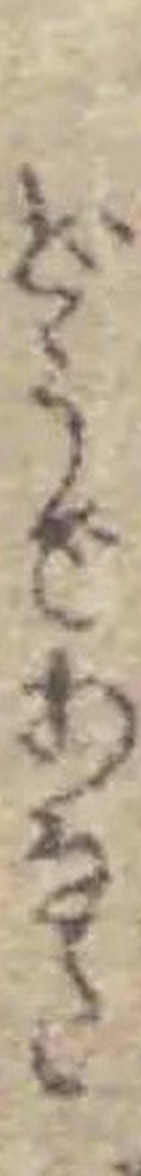どうであなた
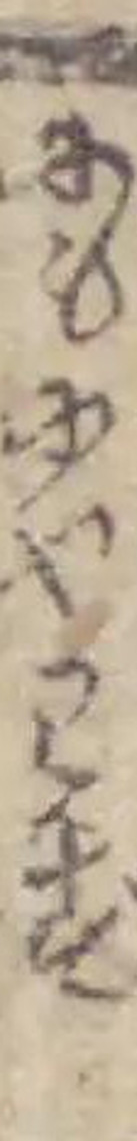にもにやわず
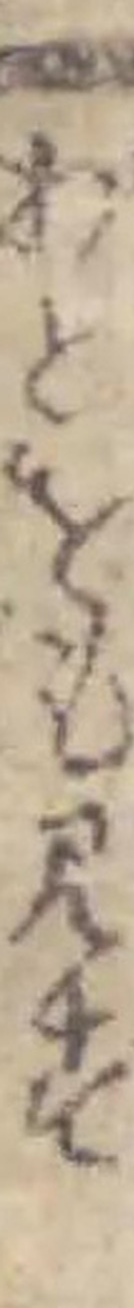あとをも見ず
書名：化物尽 4巻
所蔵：国立国会図書館 National Diet Library, JAPAN
